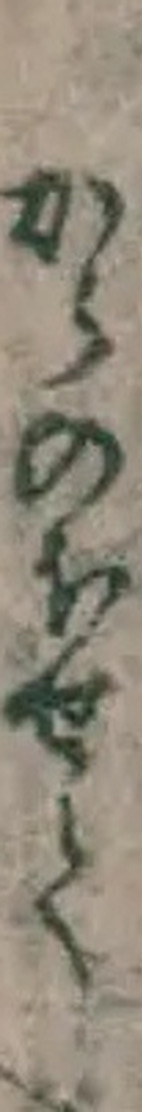からのほせて
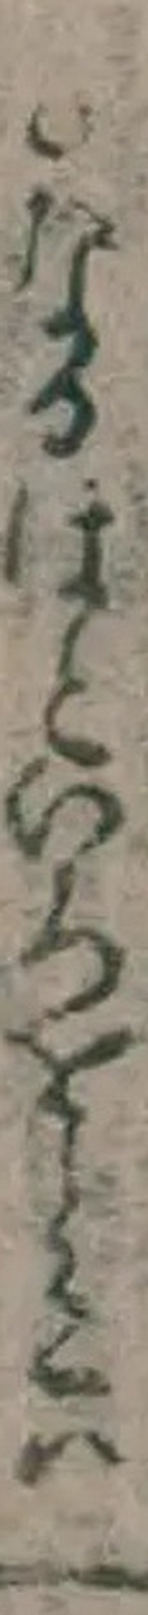○なるほといろをとこは
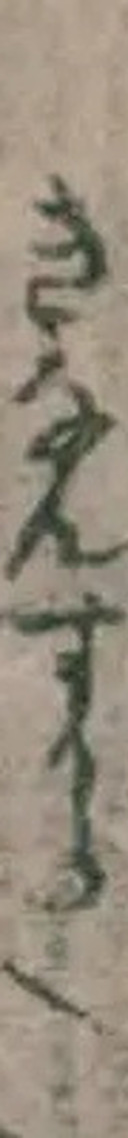きなんすから
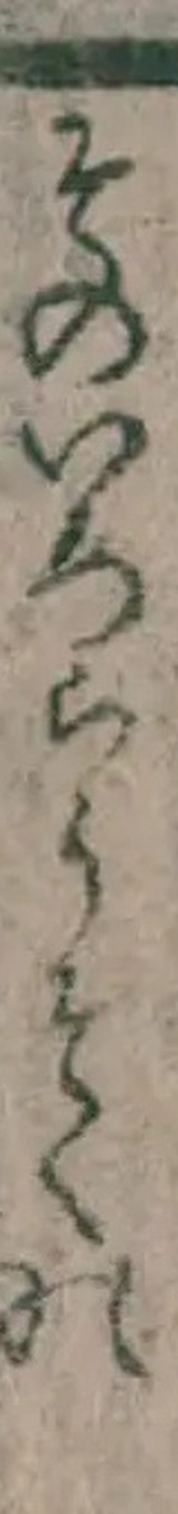そのいろらうそくの
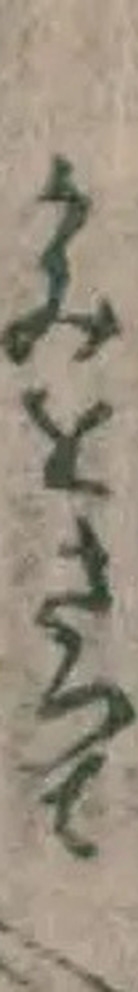かみをきつて
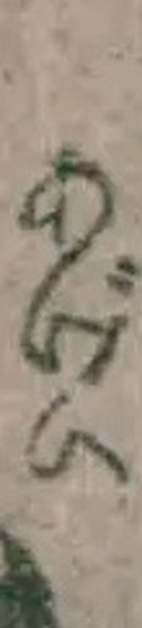あげい
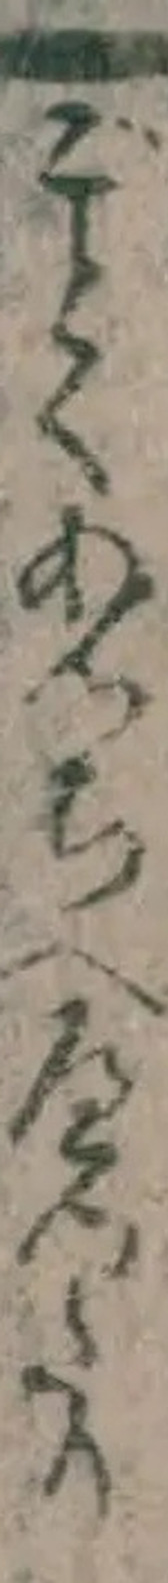ごとくあつちへへつたり
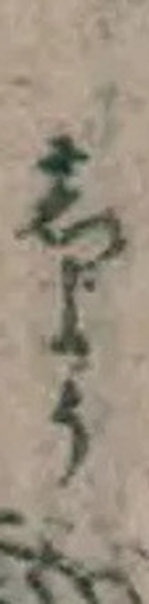しよう
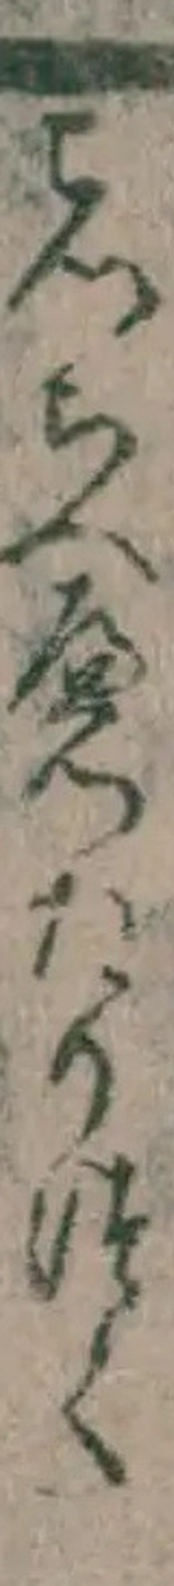こつちへへつたりつく
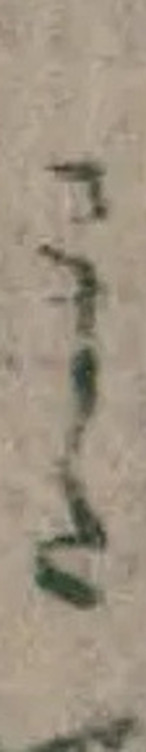さした
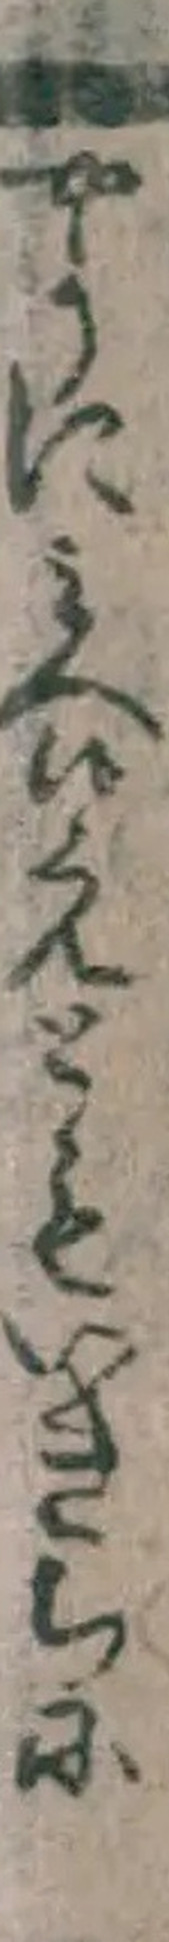やうにみへ候えともいきちに
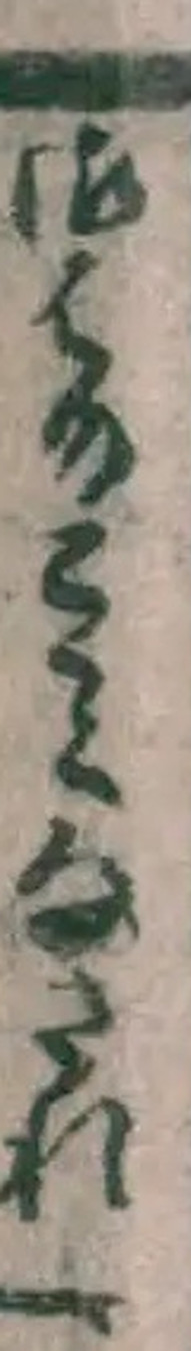御はこみなされ
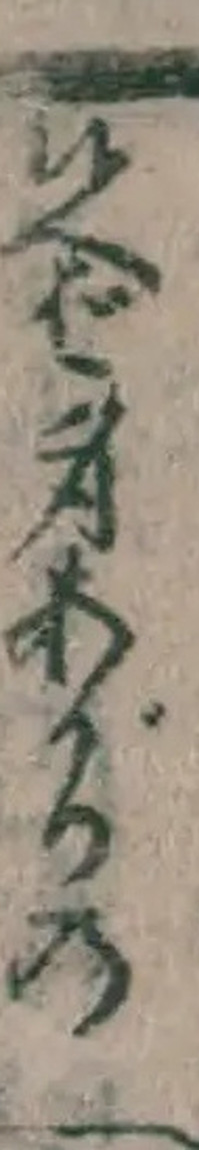候へば身あがりの
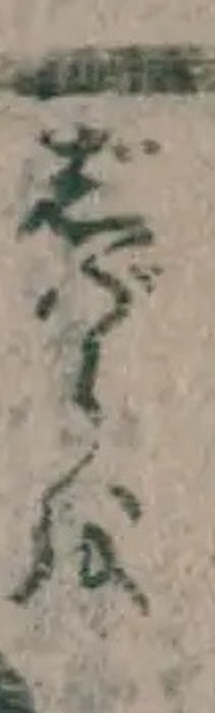じばらを
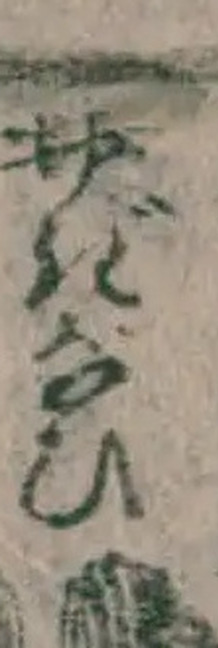おぎなひ
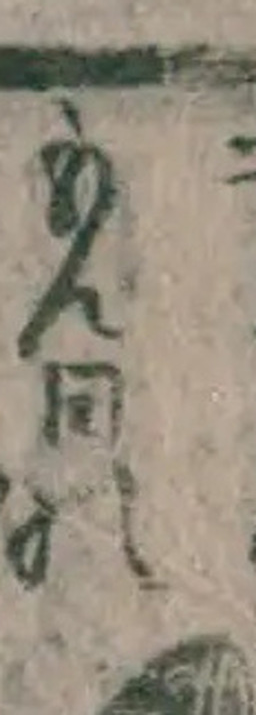もん日の
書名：視薬霞報条 3巻
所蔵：国立国会図書館 National Diet Library, JAPAN
